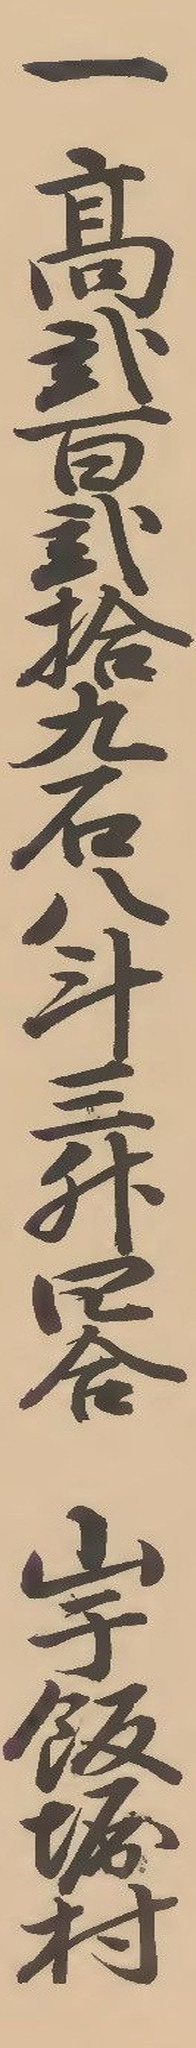一高弐百弐拾九石八斗三升四合山于飯堀村

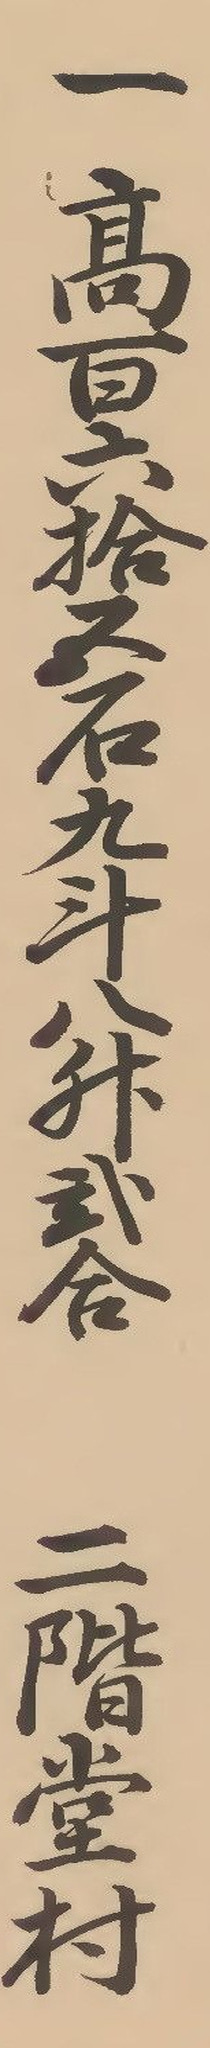一高百六拾五石九斗八升弐合二階堂村
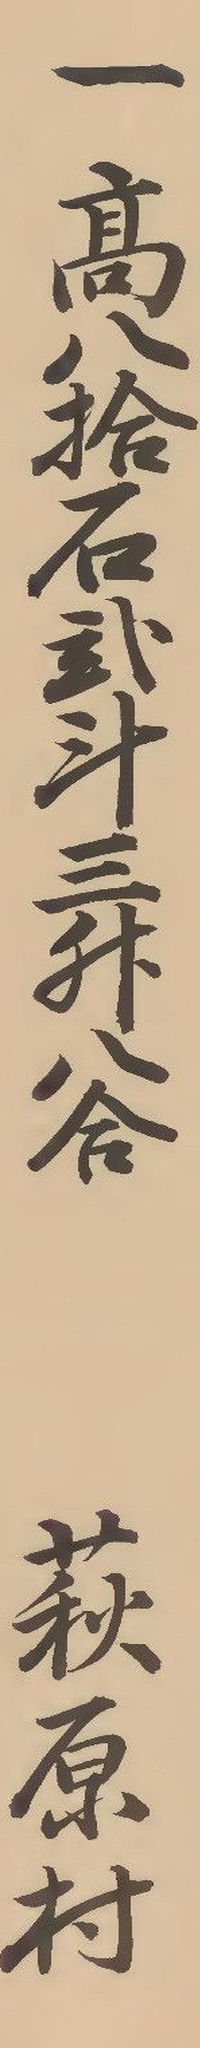一高八拾石弐斗三升八合萩原村
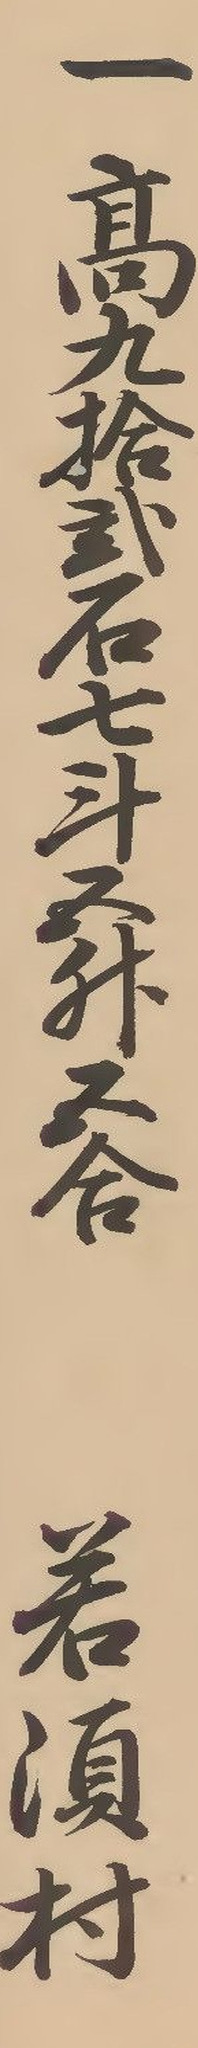一高九拾弐石七斗五升五合若須村
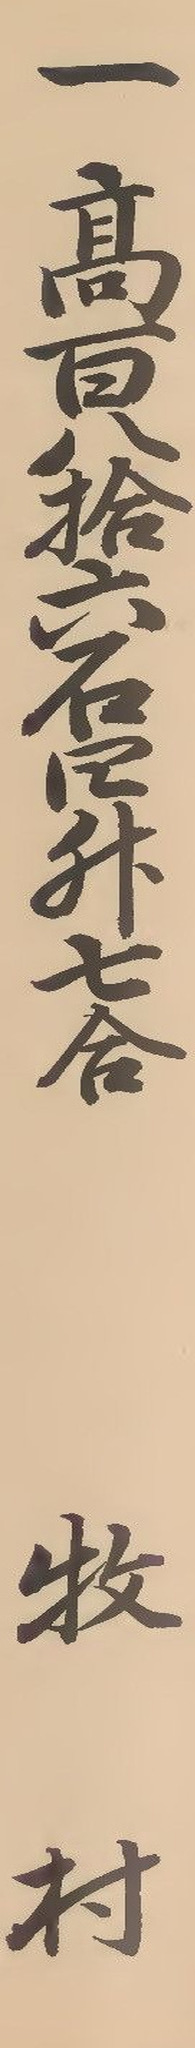一高百八拾六石四升七合牧村
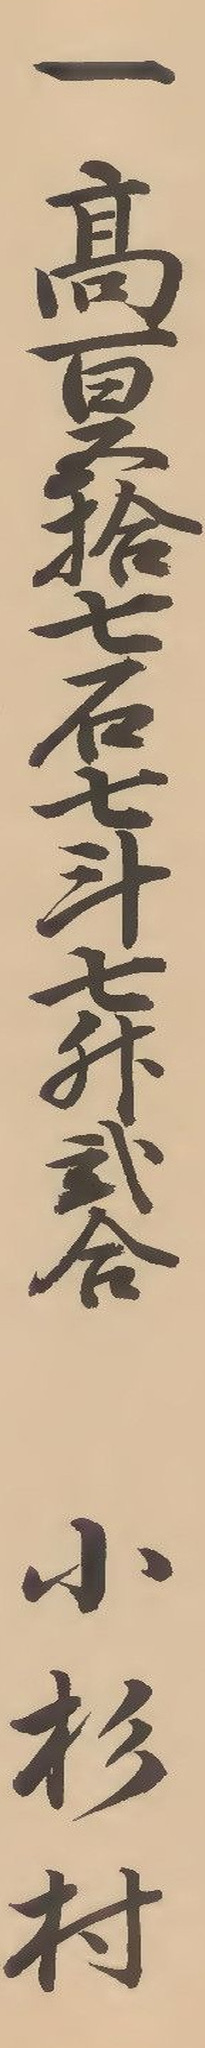一高百五拾七石七斗七升弐合小杉村
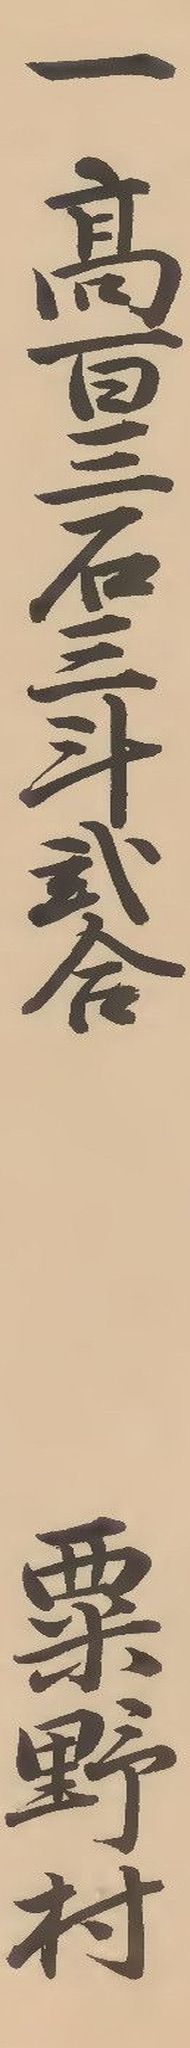一高百三石三斗弐合粟野村
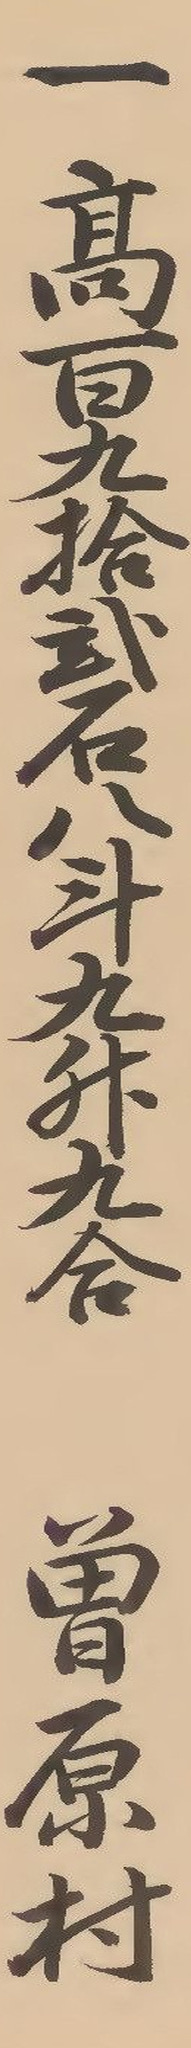一高百九拾弐石八斗九升九合曽原村

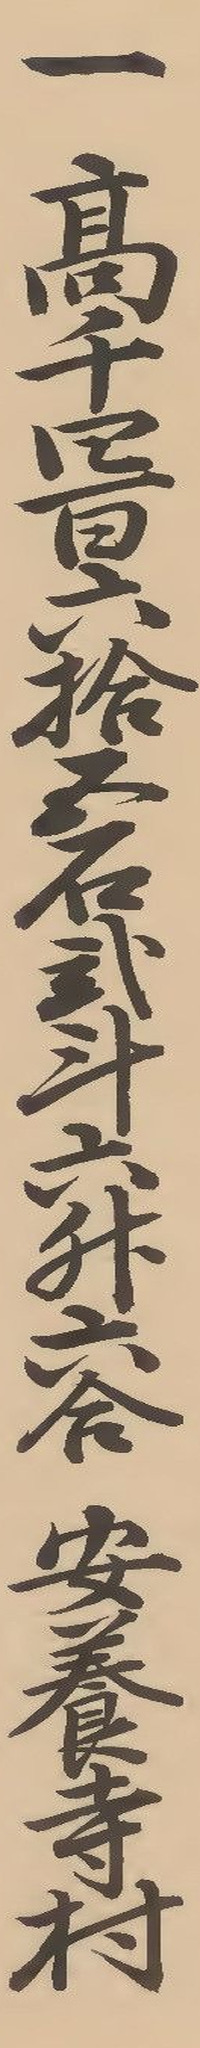一高千四百六拾五石弐斗六升六合安養寺村
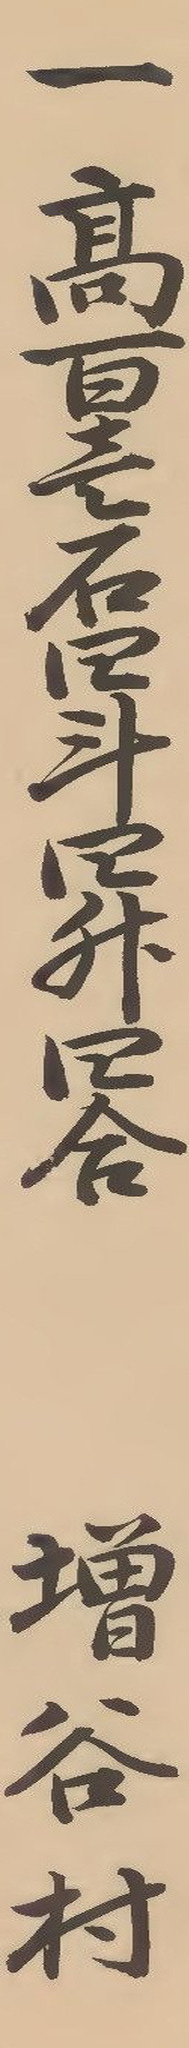一高百壱石四斗四升四合増谷村
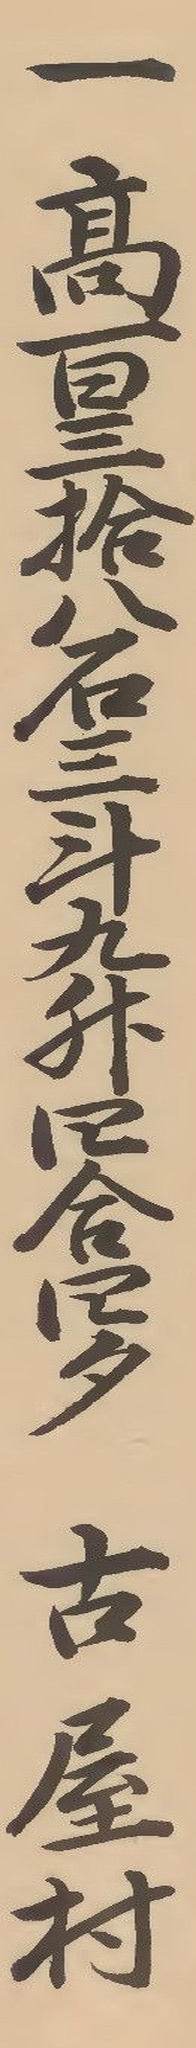一高百三拾八石三斗九升四合四勺古屋村
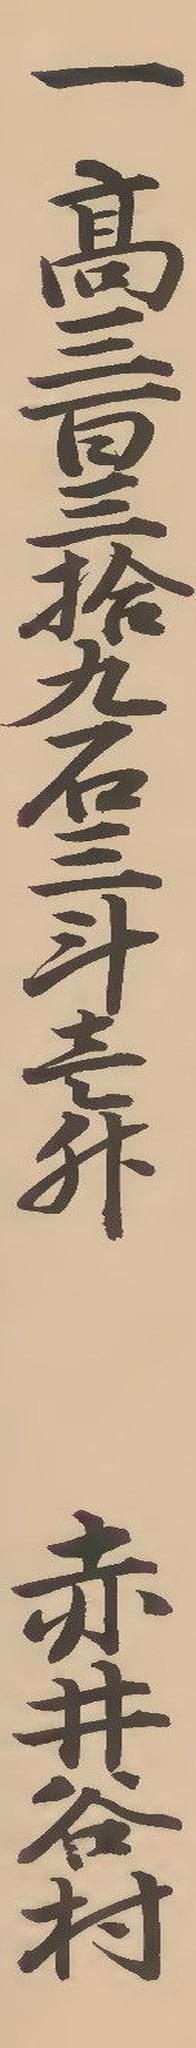一高三百三拾九石三斗壱升赤井谷村
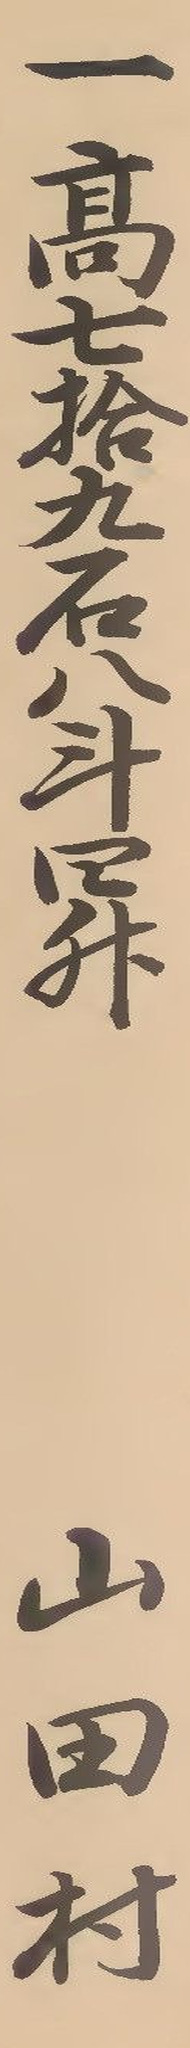一高七拾九石八斗四升山田村
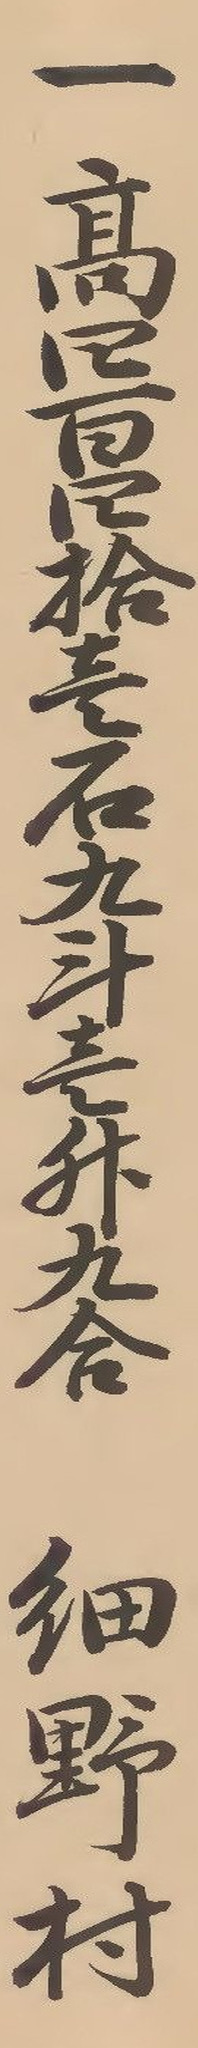一高四百四拾壱石九斗壱升九合細野村
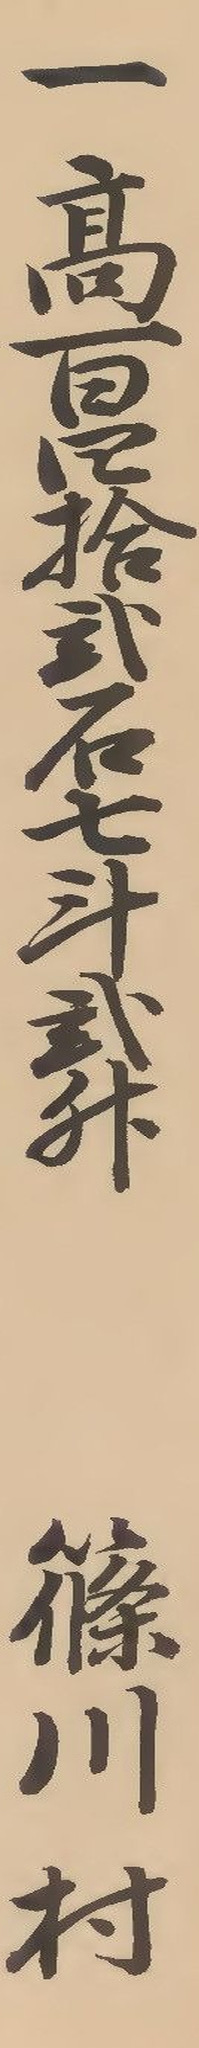一高百四拾弐石七斗弐升篠川村
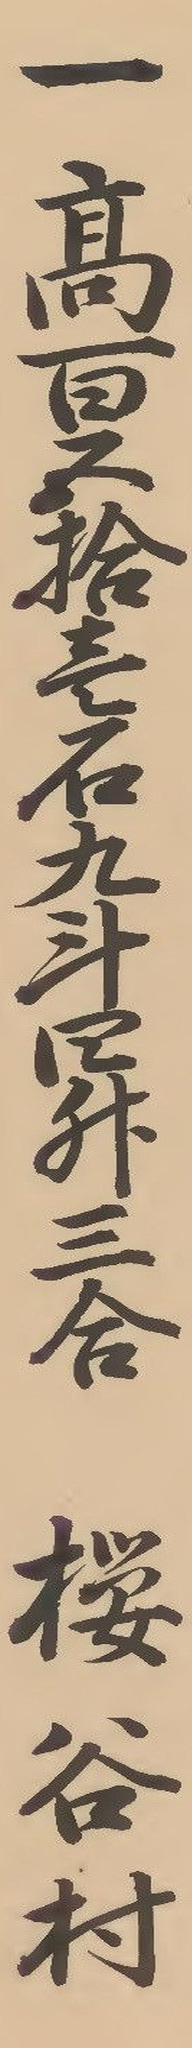一高百五拾壱石九斗四升三合桜谷村
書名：越前国郷帳
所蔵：国立公文書館 National Archives of Japan
